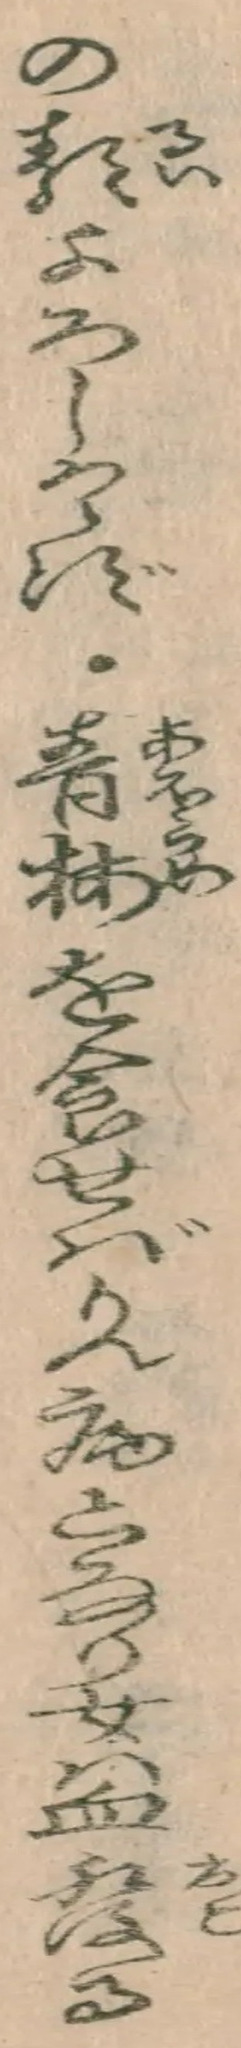の類よろしからず・青梅を食せばりん病となり女は血発る
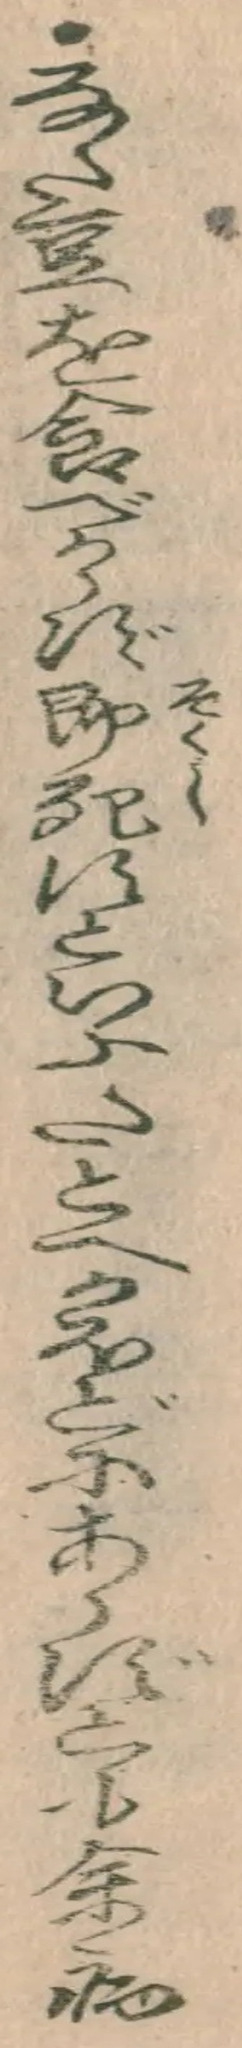・なた豆を食べからず即死すといふたとへかほどにあらずとも余病

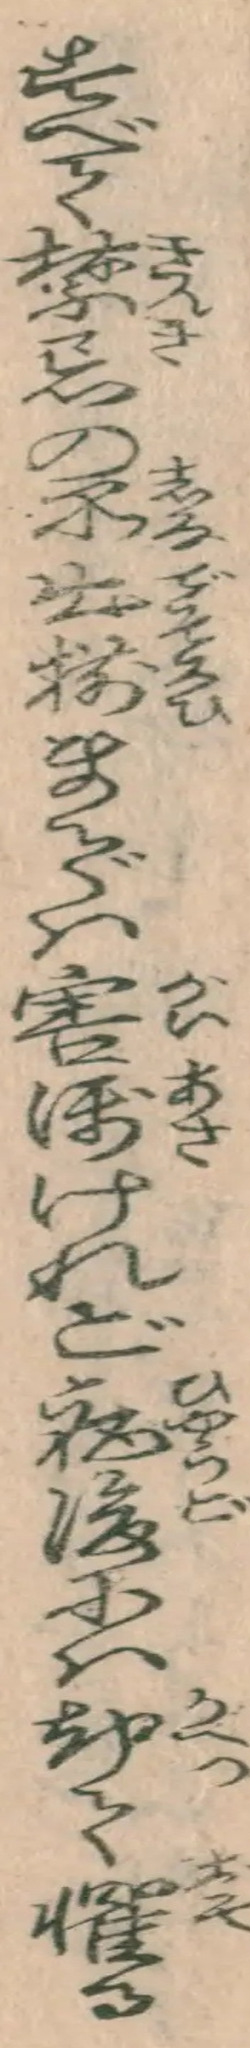すべて禁忌の品出揃までは害浅けれど病後には却て懼る
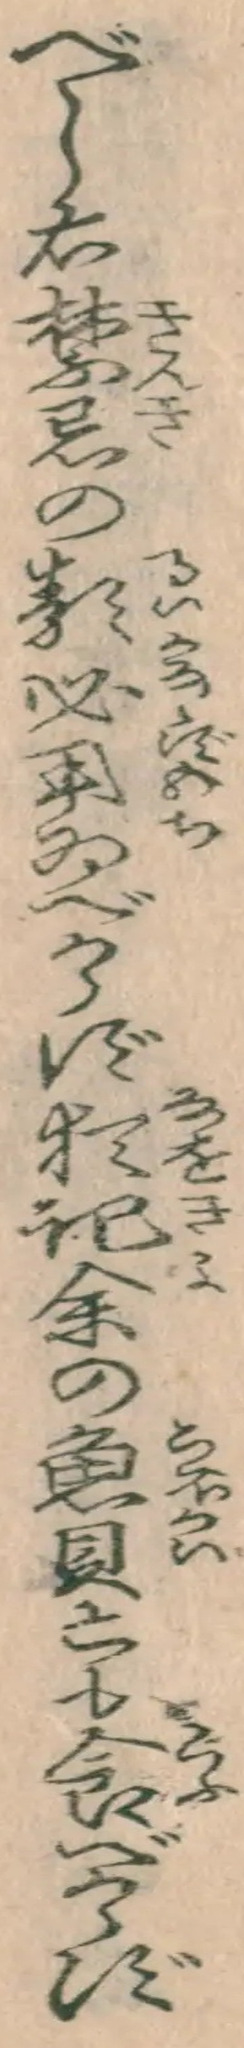べし右禁忌の類必用ゐべからず猶記余の魚貝とも食べからず
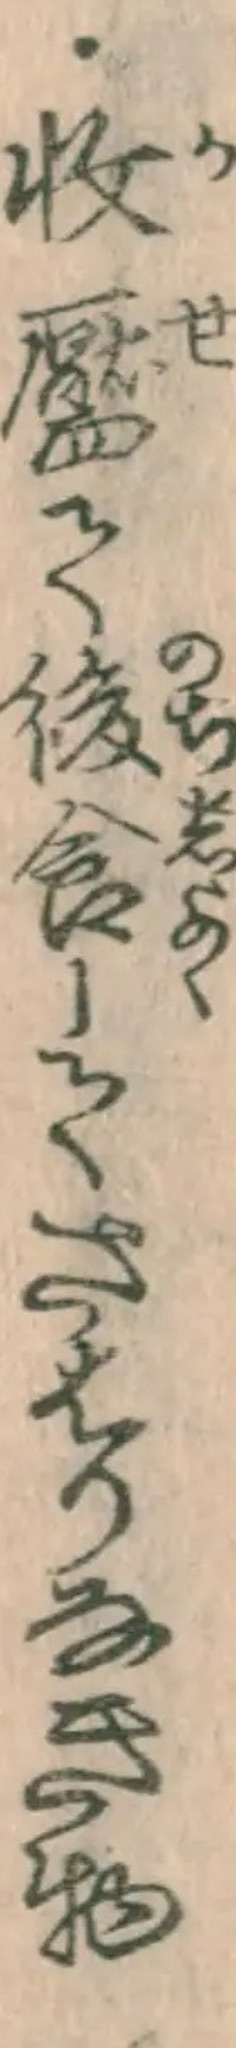・収靨て後食してさはりなき物
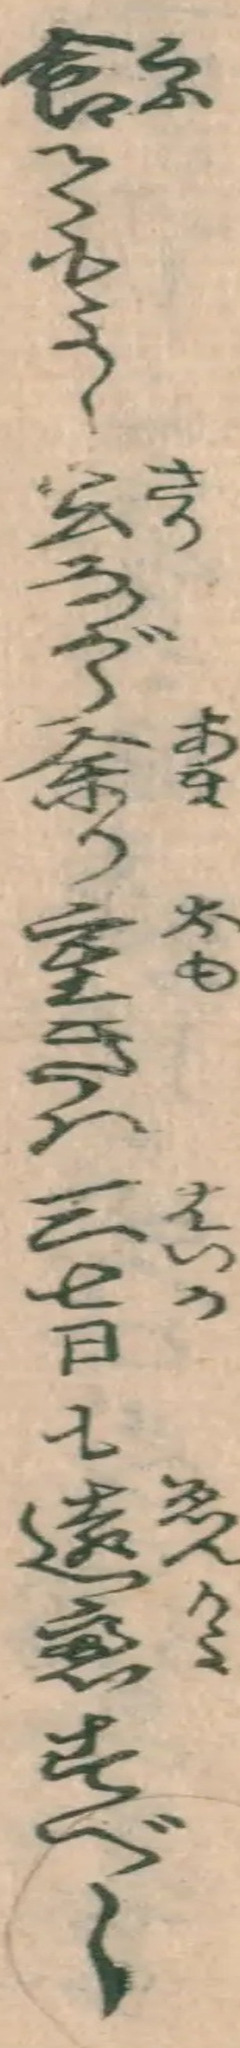食てもよし去ながら余り重きは三七日も遠慮すべし
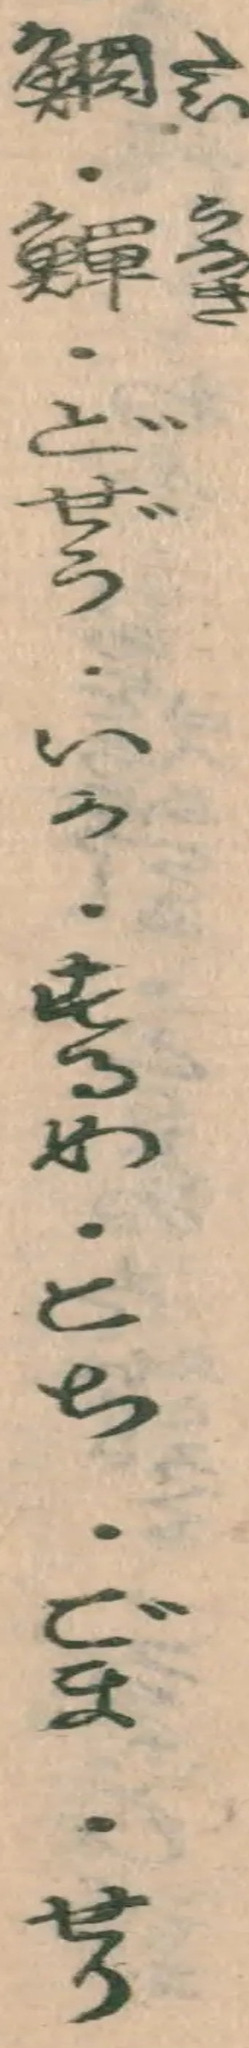・鯛・鱓・どぜう・いか・するめ・とち・ごま・せり
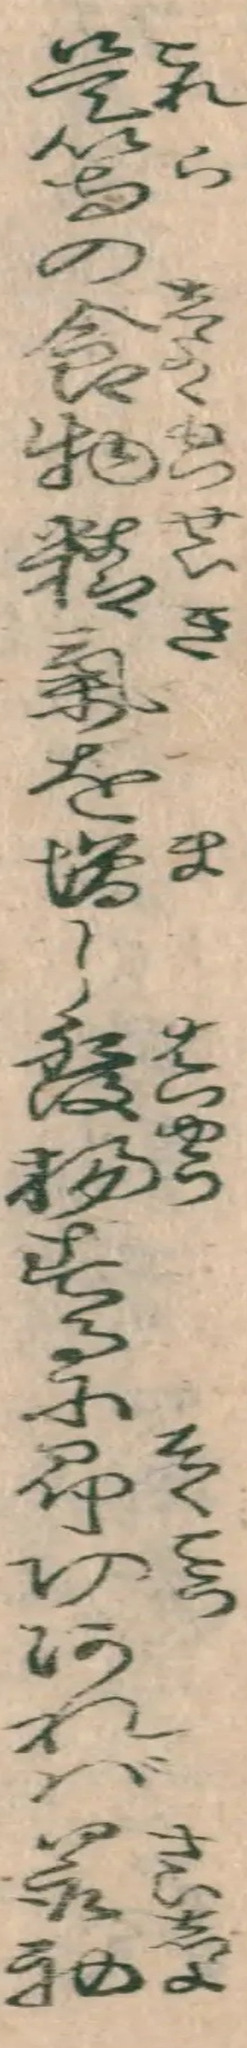是等の食物精気を増し発揚するに即功あれば最初
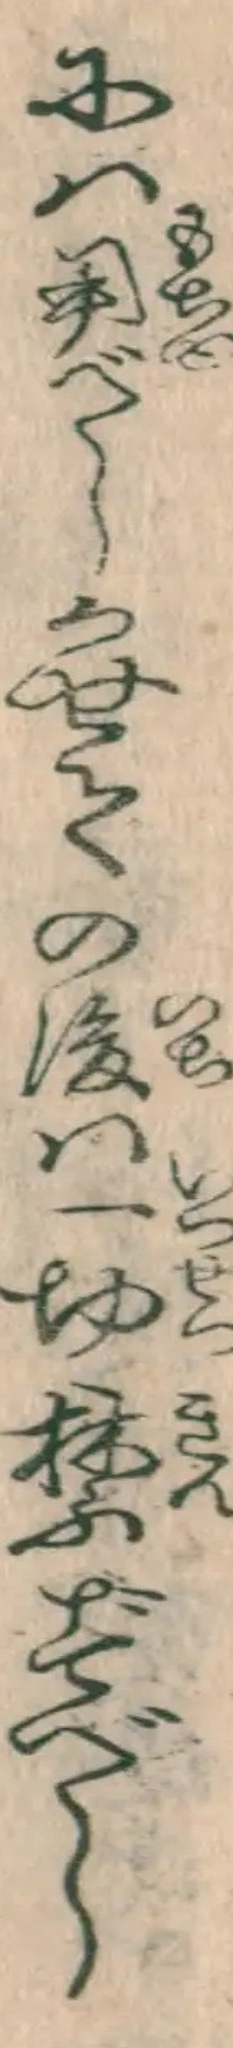には用べしかせての後は一切禁ずべし
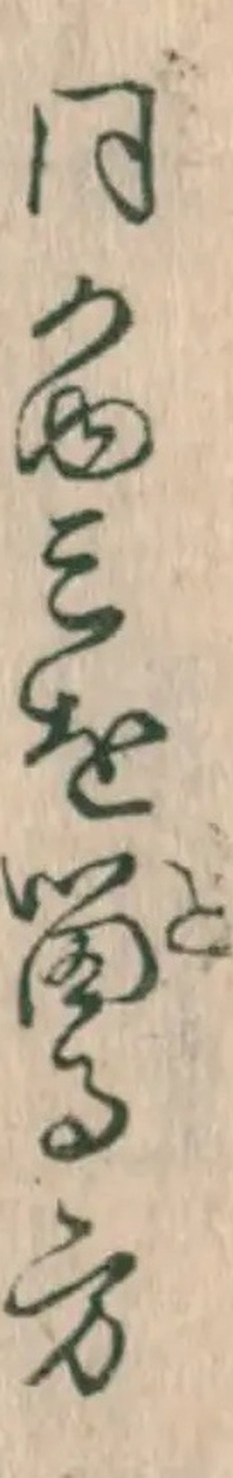同かゆみを留る方
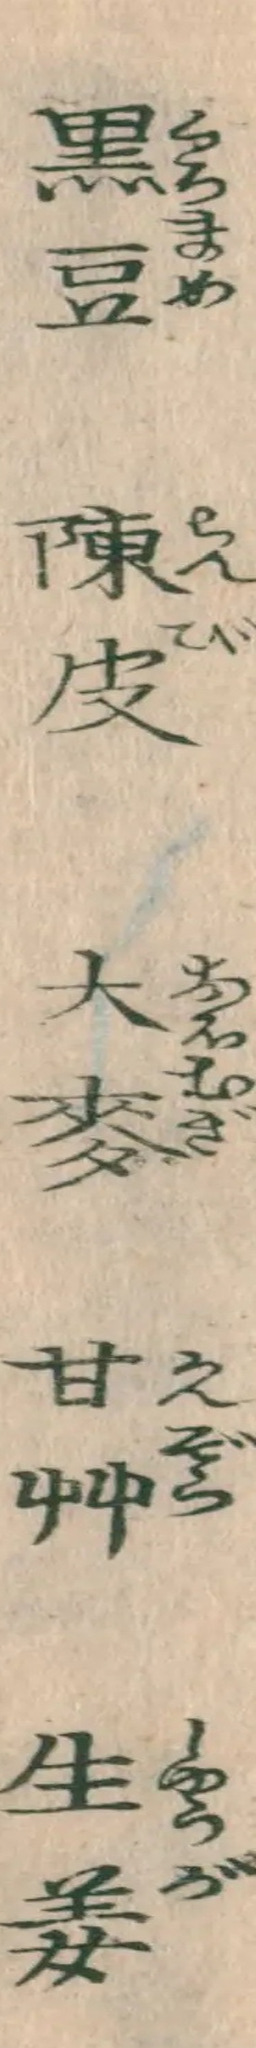黒豆陳皮大麦甘艸生姜
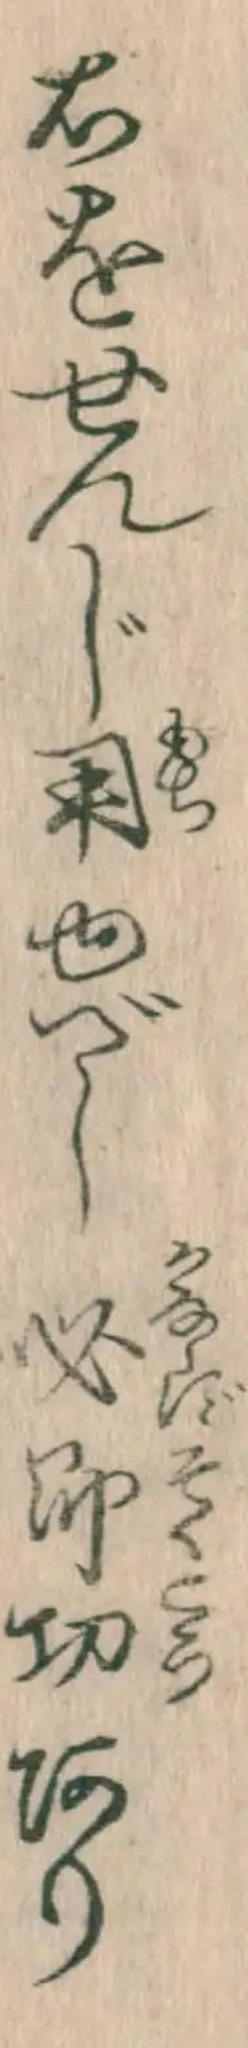右をせんじ用ゆべし必即功あり
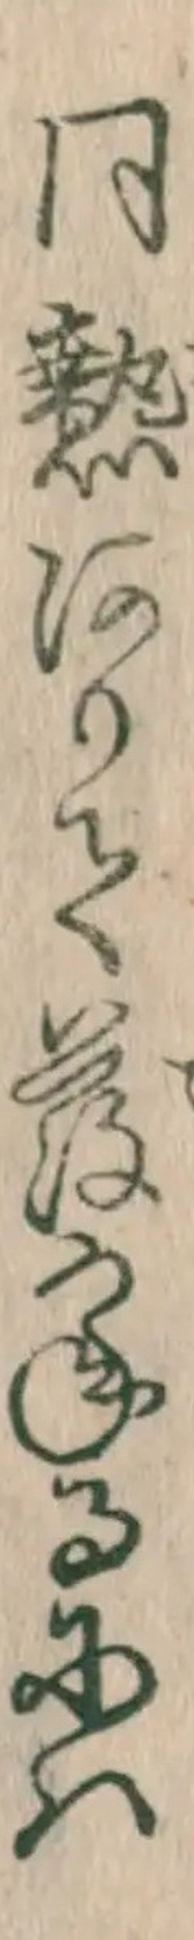同熱ありて発かねるには
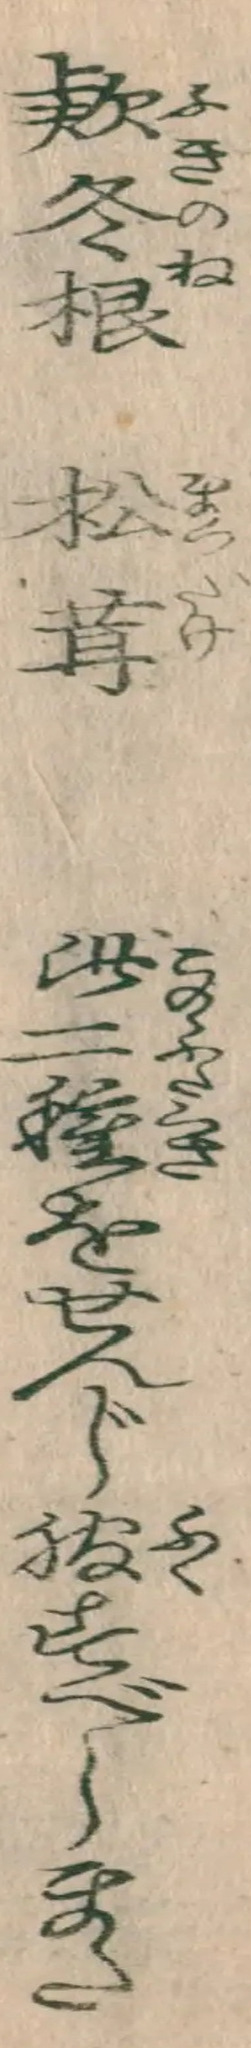欸冬根松茸此二種をせんじ服すべしまた

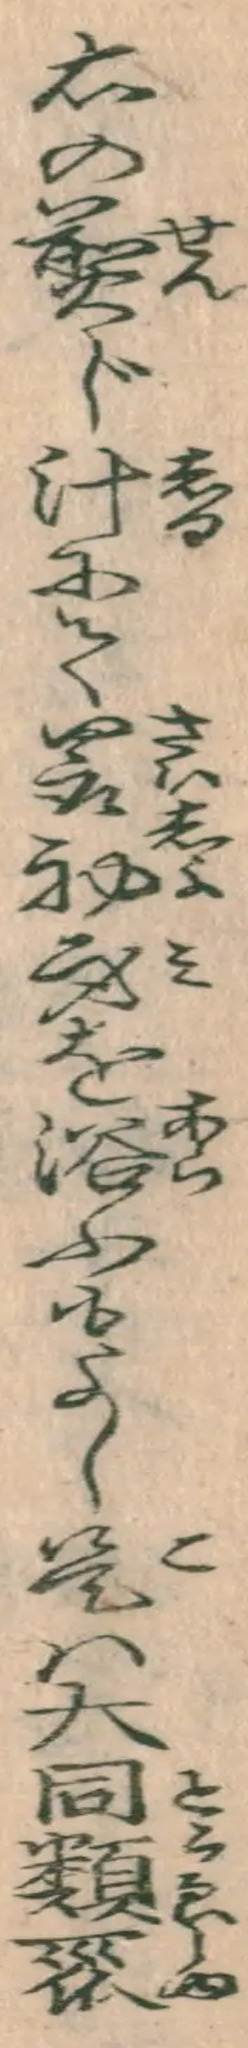右の煎じ汁にて最初身を浴ふもよし是は大同類衆
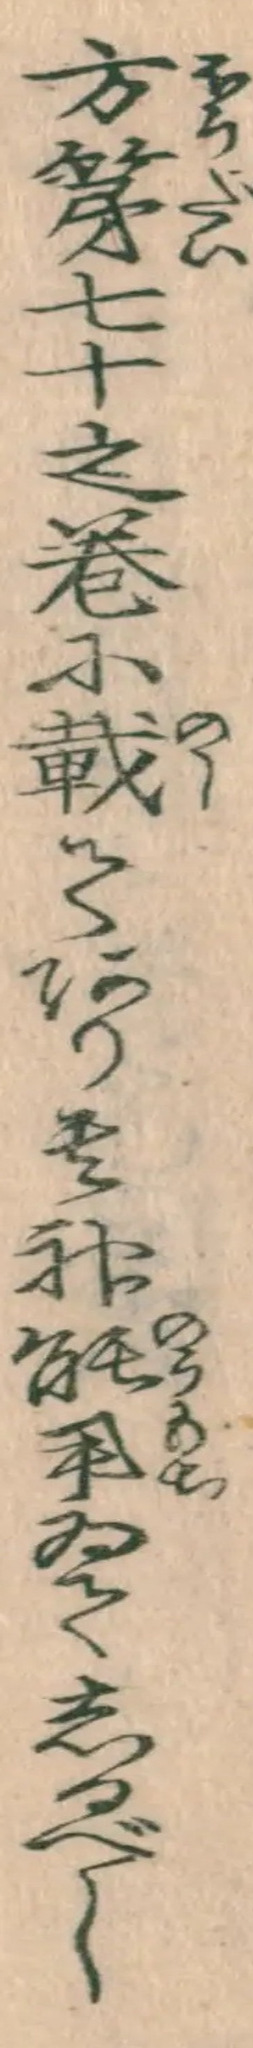方第七十之巻に載てあり其神能用ゐてしるべし
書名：麻疹養生鑑
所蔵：国立国会図書館 National Diet Library, JAPAN
